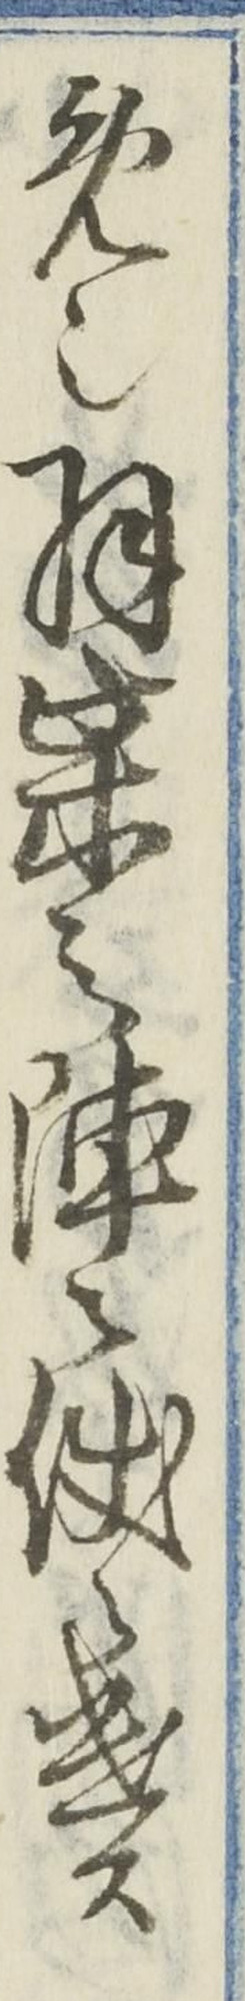免シ羽柴之陣ニ使ニ遣ス
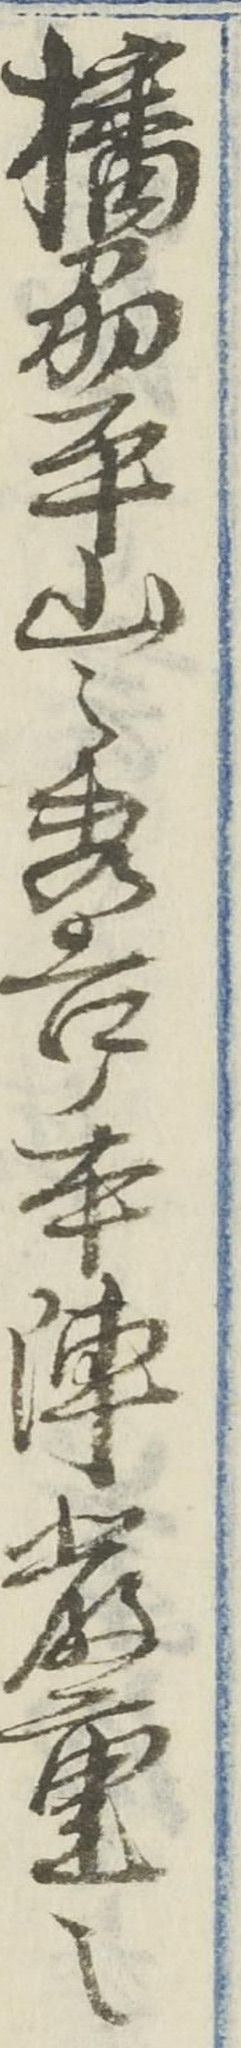播州平山之秀吉ノ本陣厳重也
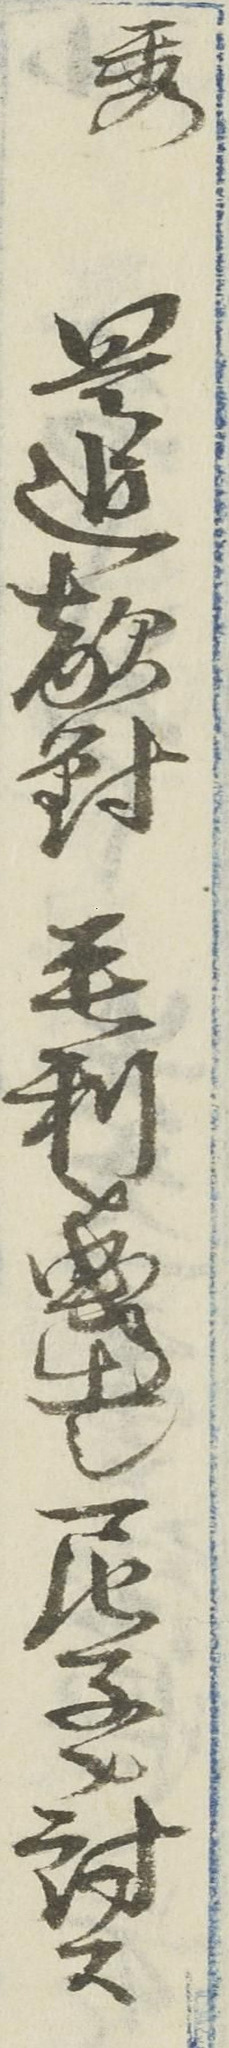秀是迄敵対毛利ヲ曳出シ尼子ヲ討ス
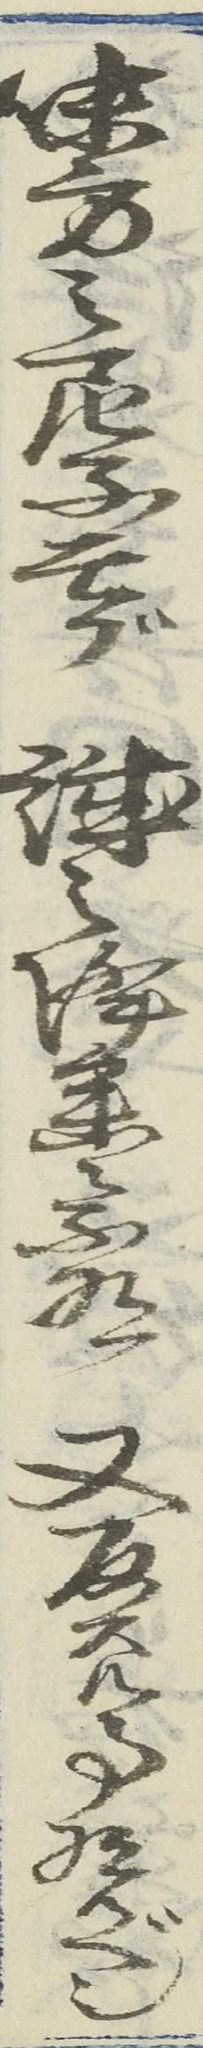味方之尼子そグ誠之降参ニ不有又反スル事有ルベシ
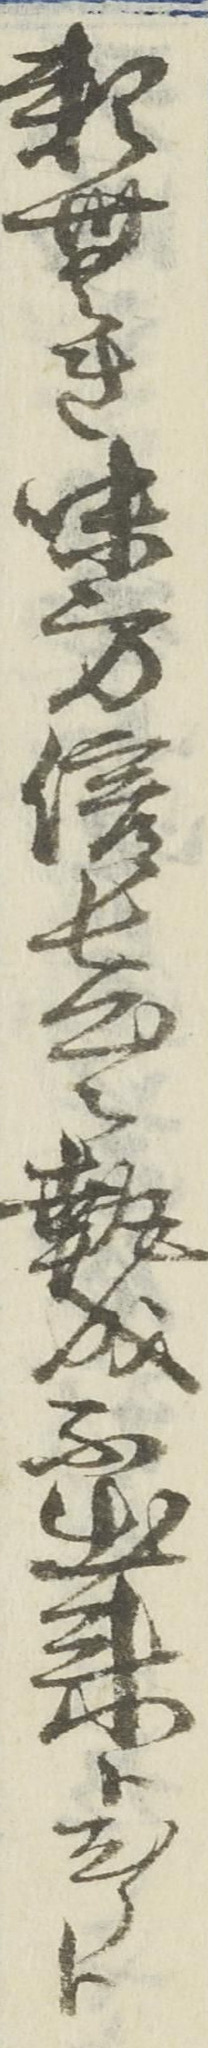頼無き味方信長公ニ執成不出来と云うト
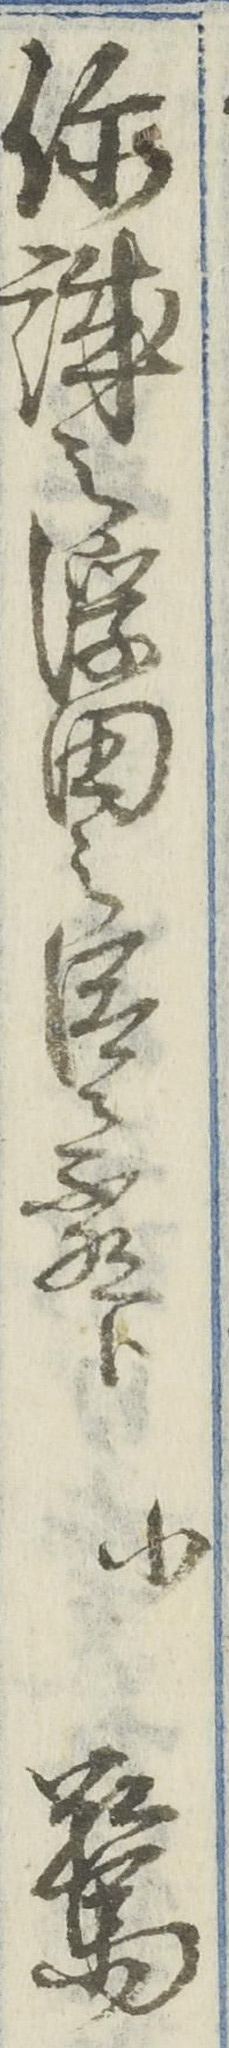你謀之浮田之臣ニ不有ト小驚
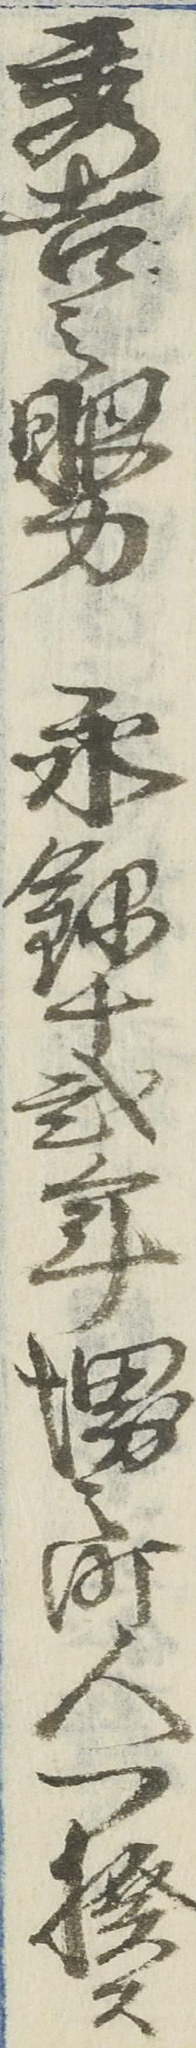秀吉之眼力永禄十弐年堺之町人一揆ス
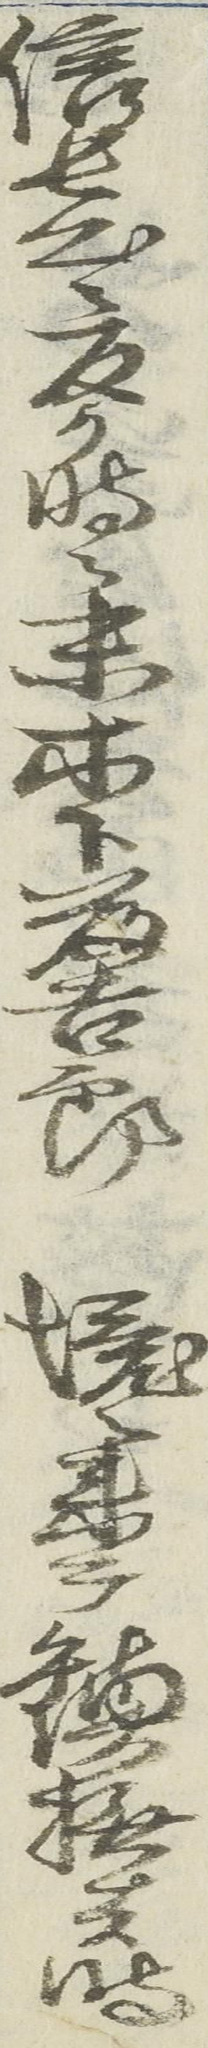信長公之反リ時之末木下藤吉郎境ニ来テ鎮撫ナス時
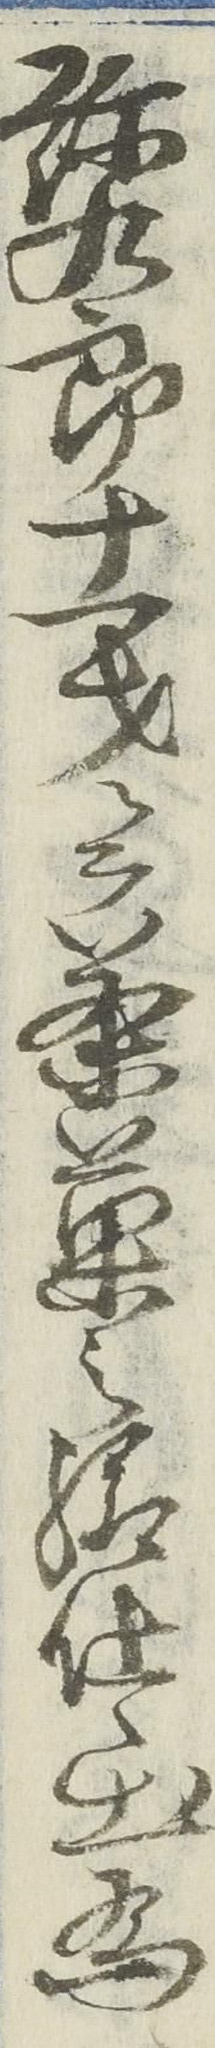弥九郎十一才ニテ茶菓之給仕ニ出為
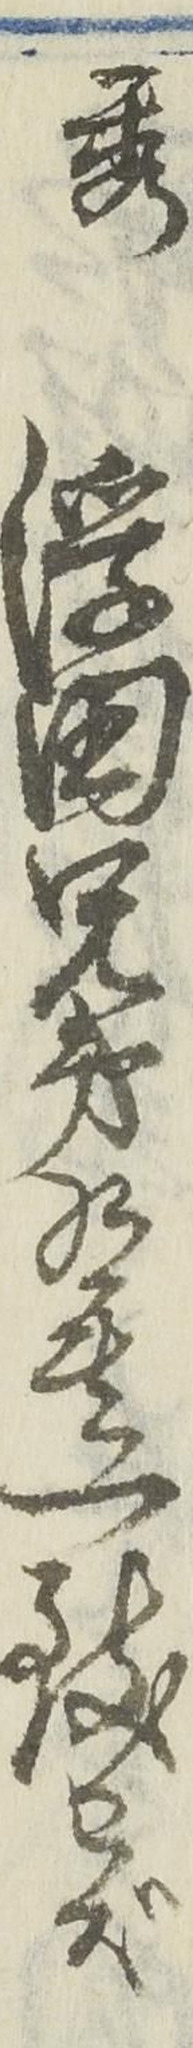秀浮田兄弟有共一致セズ
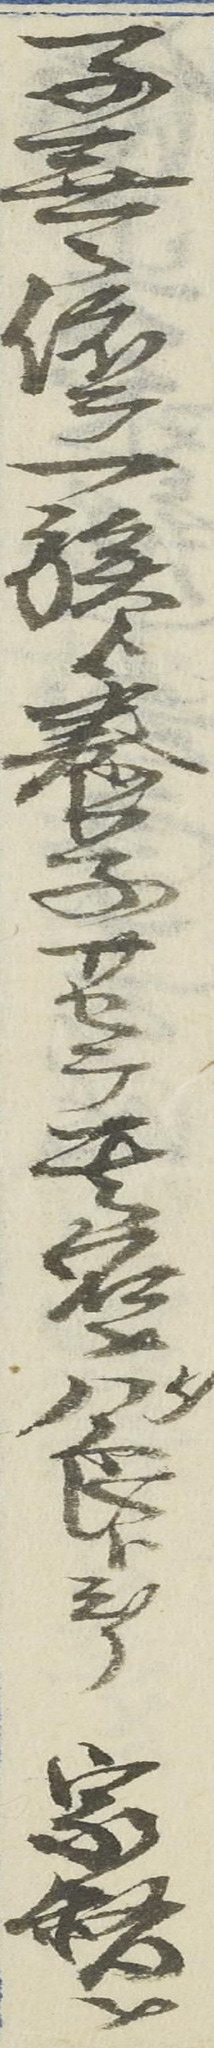子無ニ依テ一族ゟ養子サセテ其名ヲタ？八郎ト云う家督ヲ
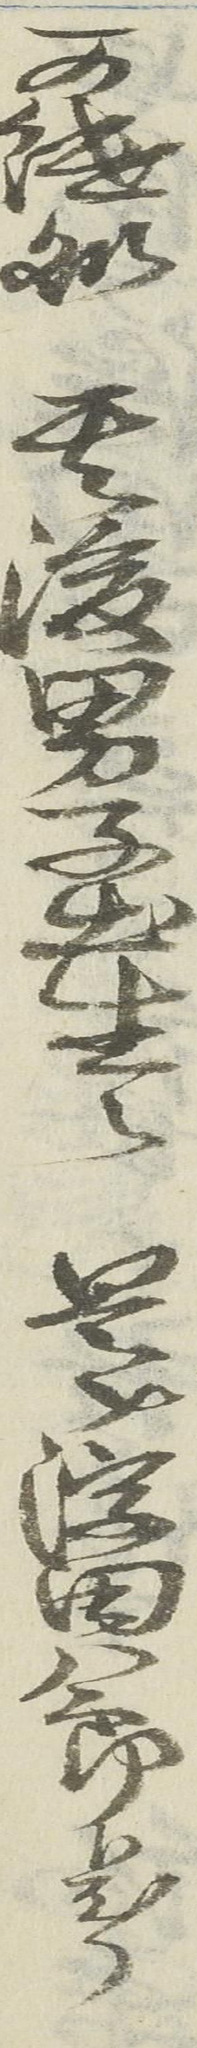可継処其後男子出生シ是ヲ浮田八郎ト云う
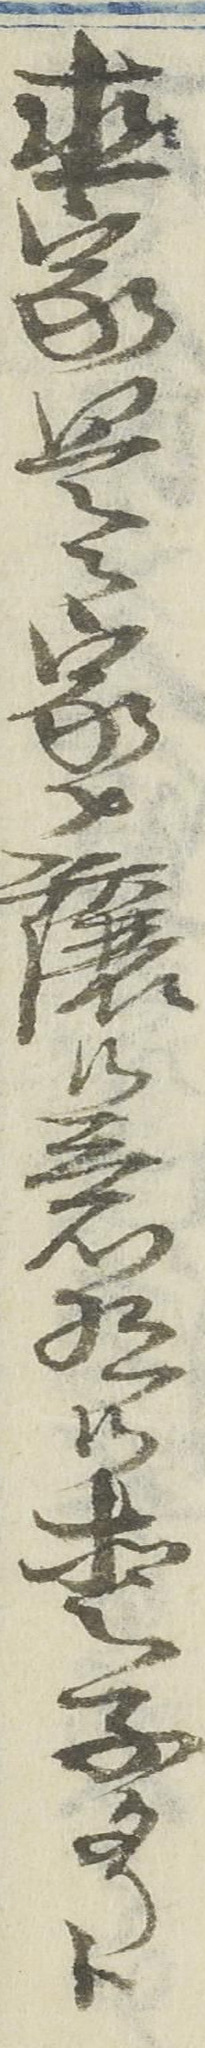直家是ニ家ヲ譲ル意有ル養子タリト

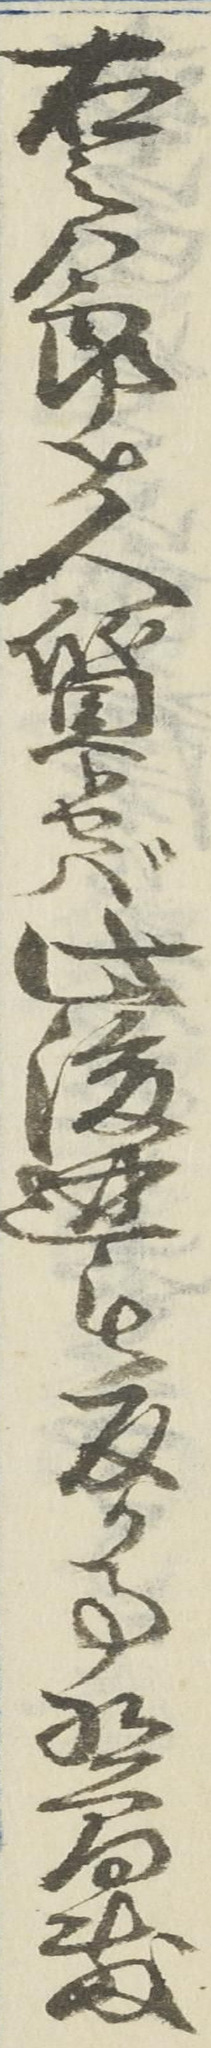右之八郎ヲ人質トセバ此後迚も反り事有間敷
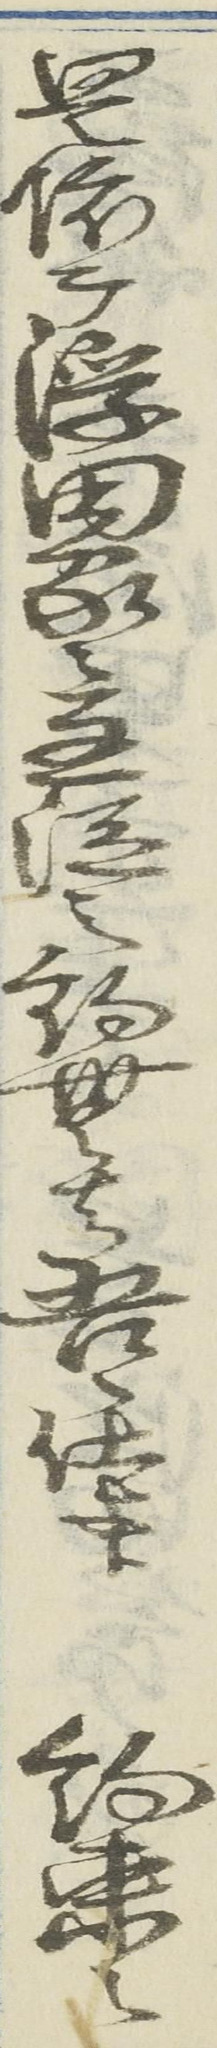是依テ浮田家之主従之約無は吾ニ仕よト約束之
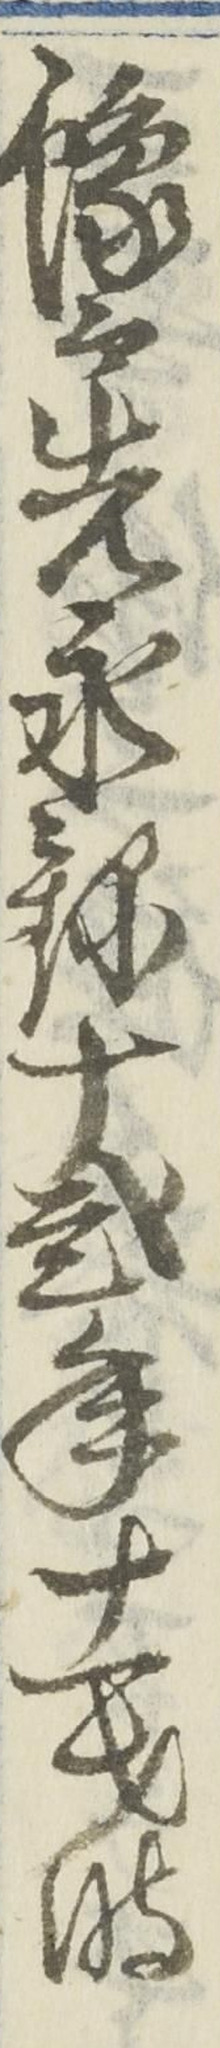豫而先永禄十弐年十一才時
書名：伏水大地震
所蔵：東京大学地震研究所図書室 Earthquake Research Institute Library, The University of Tokyo, JAPAN
